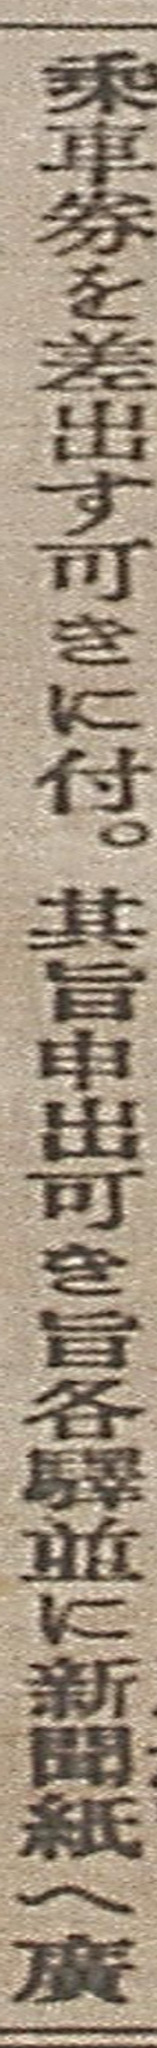乗車券を差出す可きに付。其旨申出可き旨各駅並に新聞紙へ広
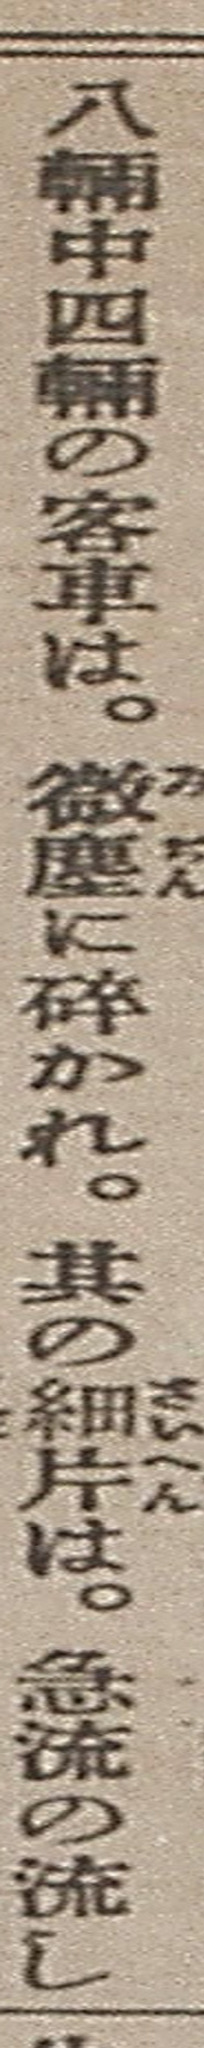八両中四両の客車は。微塵に砕かれ。其の細片は。急流の流し
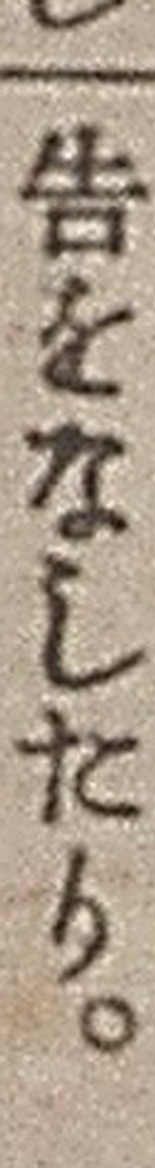告をなしたり。
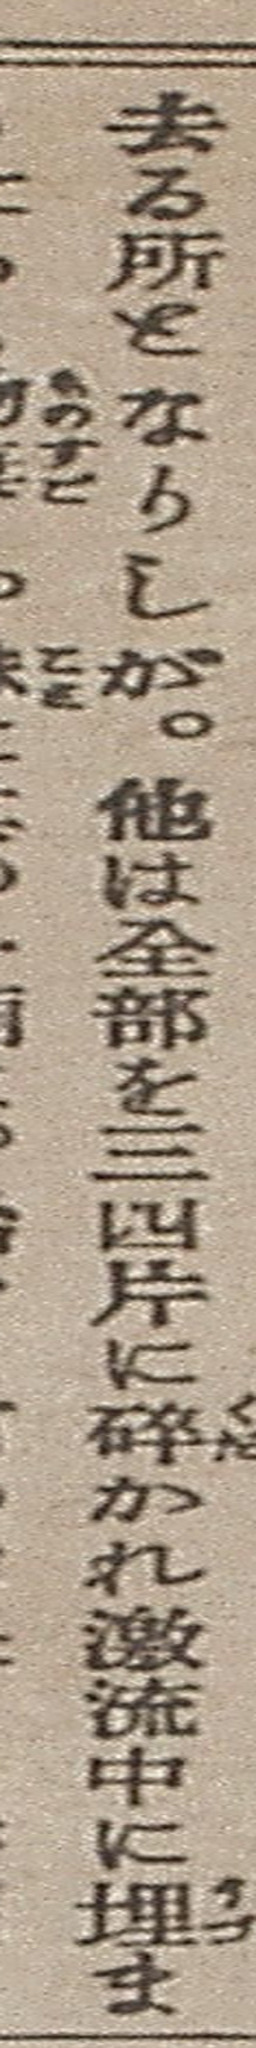去る所となりしが。他は全部を三四片に砕かれ激流中に埋ま
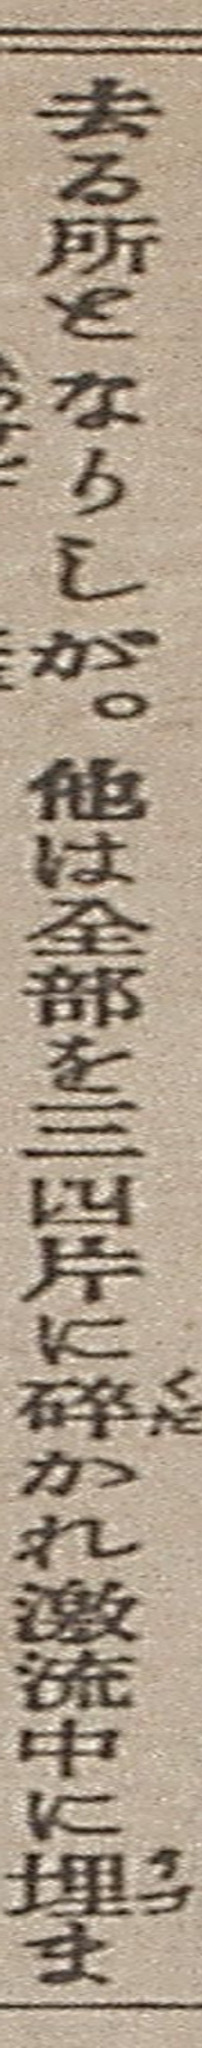去る所となりしが。他は全部を三四片に砕かれ激流中に埋ま
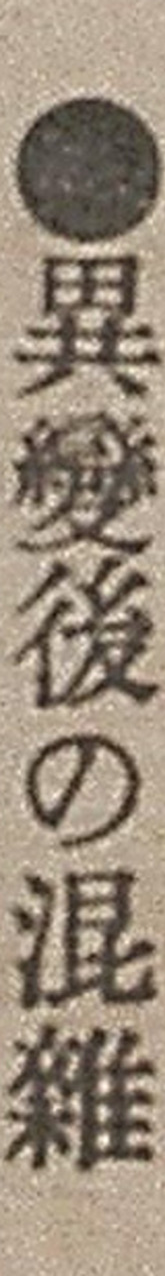●異変後の混雑
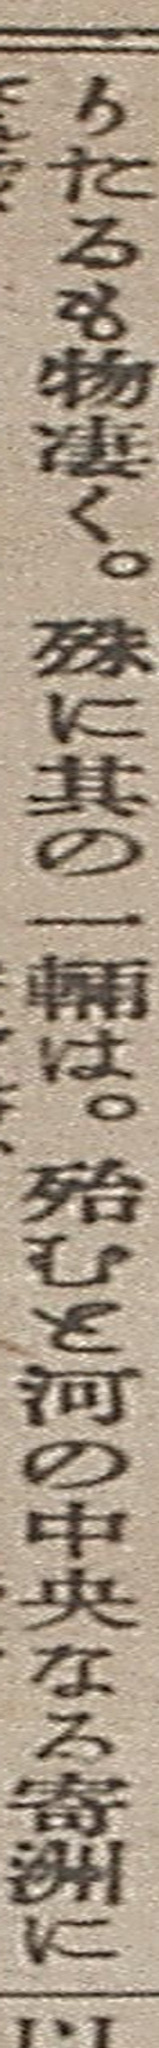りたるも物凄く。殊に其の一両は。殆むと河の中央なる寄洲に
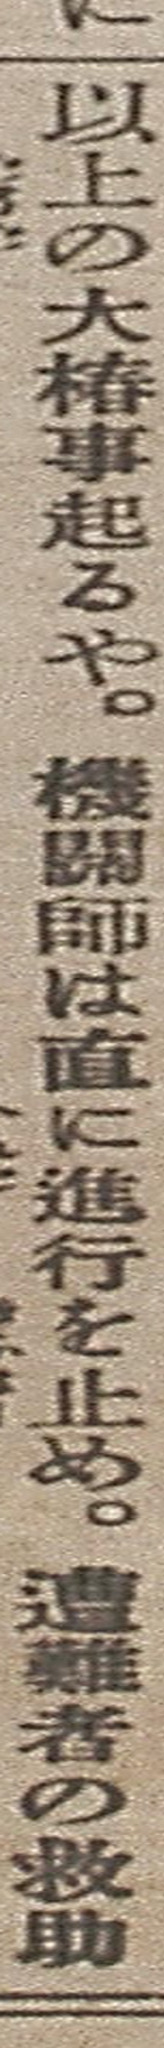以上の大椿事起るや。機関師は直に進行を止め。遭難者の救助
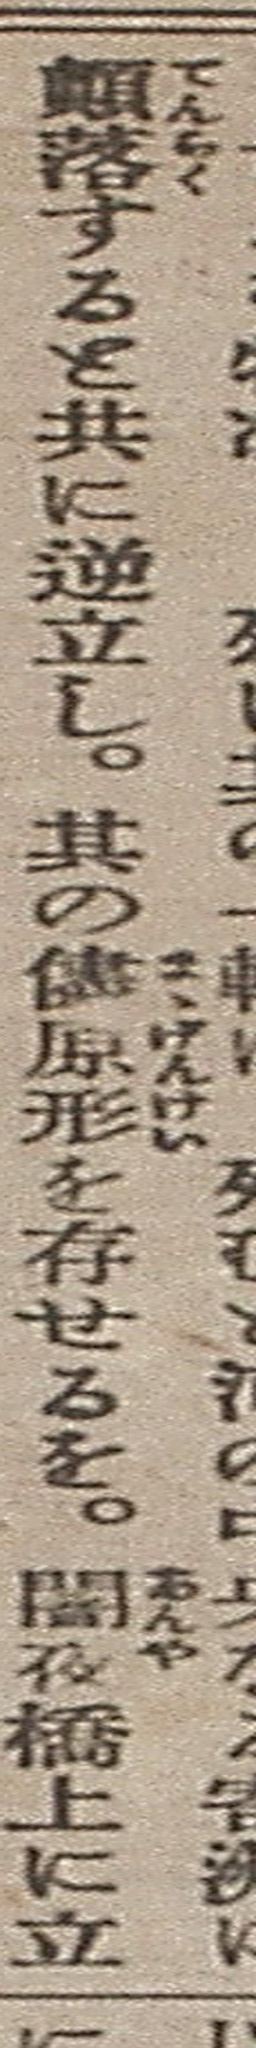顛落すると共に逆立し。其の侭原形を存せるを。暗夜橋上に立
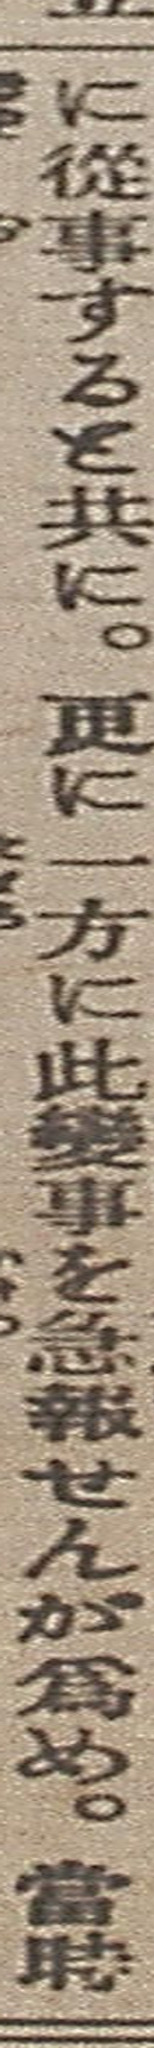に従事すると共に。更に一方に此変事を急報せんが為め。当時
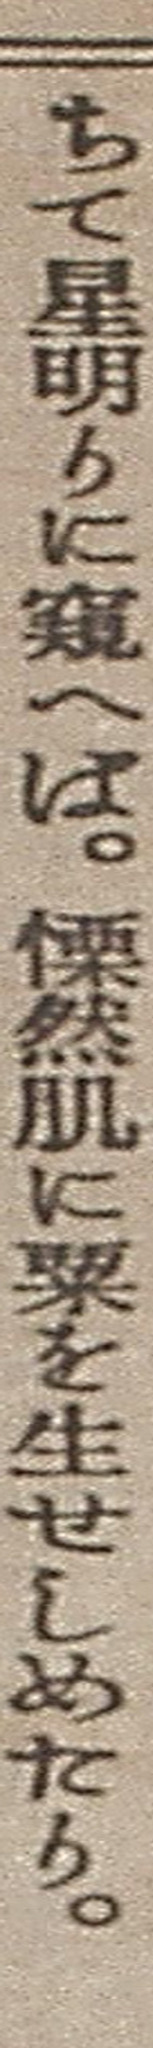ちて星明りに窺へば。慄然肌に粟を生せしめたり。
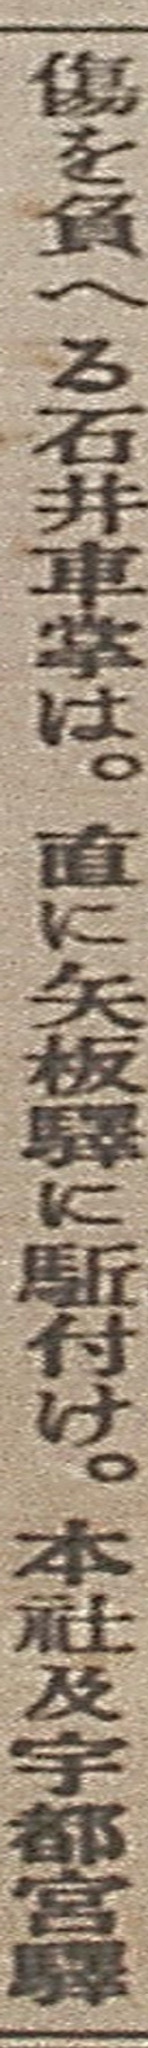傷を負へる石井車掌は。直に矢板駅に駈付け。本社及宇都宮駅
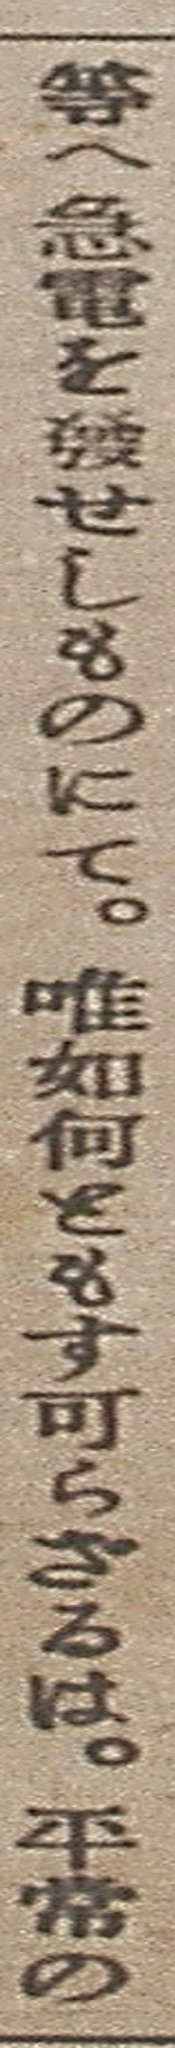等へ急電を発せしものにて。唯如何ともす可らざるは。平常の
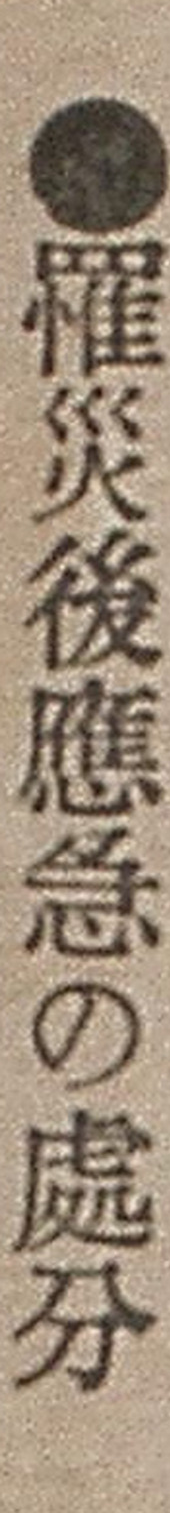●罹災後応急の処分
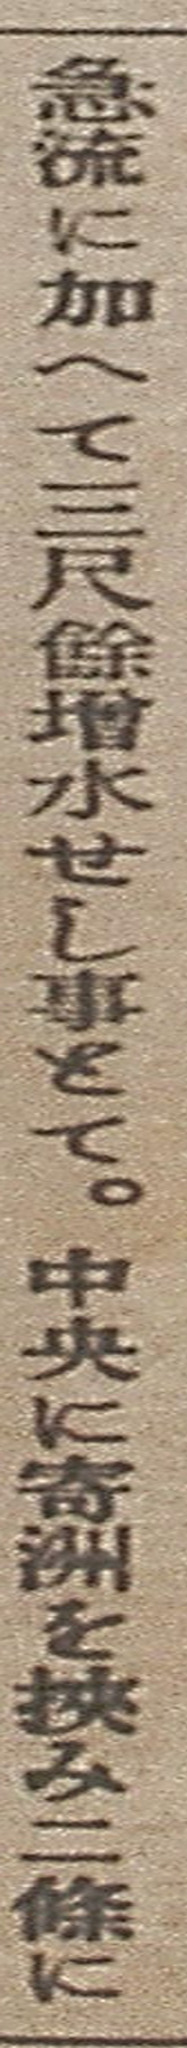急流に加へて三尺余増水せし事とて。中央に寄洲を挟み二条に
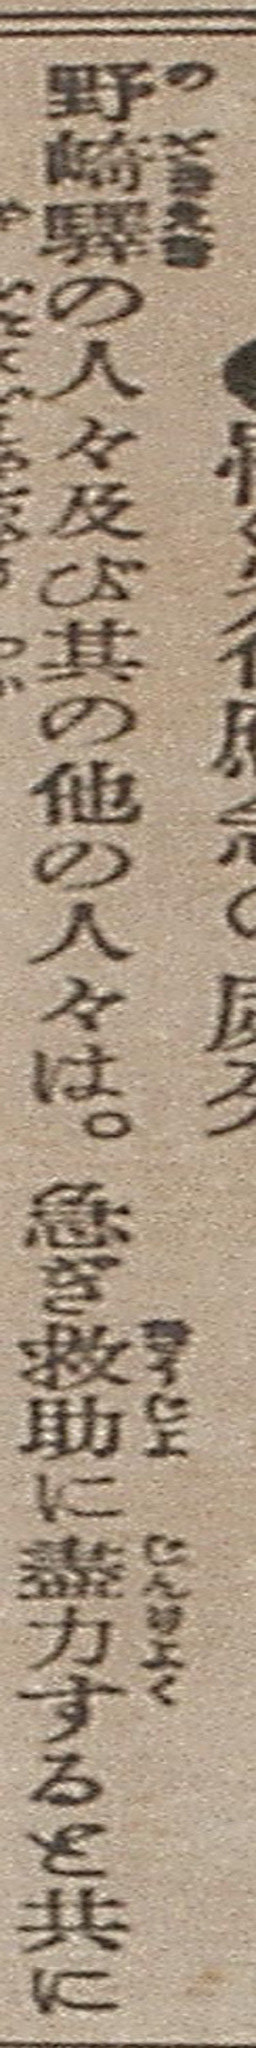野崎駅の人々及び其の他の人々は。急ぎ救助に尽力すると共に
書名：風俗畫報臨時増刊第百九十九號　明治三十二年十月各地災害圖會（前編之續）
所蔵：東京大学地震研究所図書室 Earthquake Research Institute Library, The University of Tokyo, JAPAN
